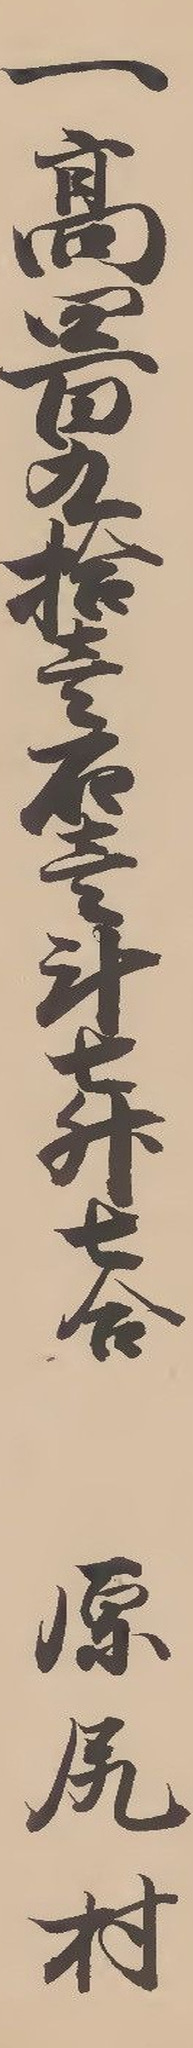一高四百九拾壱石壱斗七升七合原尻村
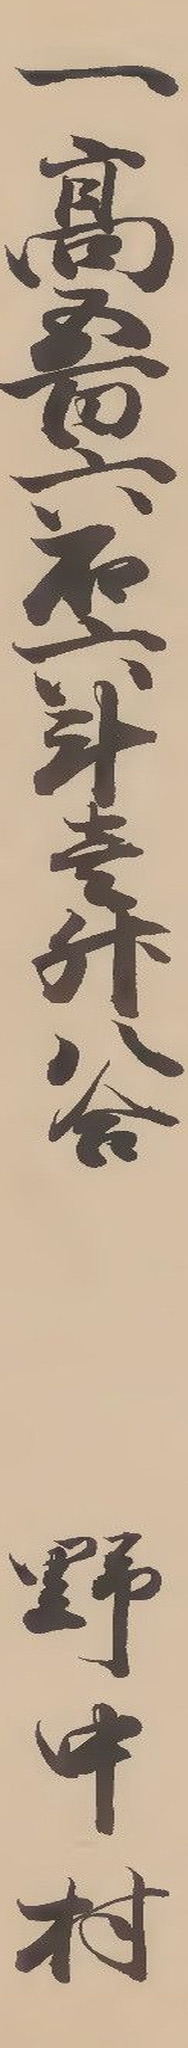一高五百六石六斗壱升八合野中村
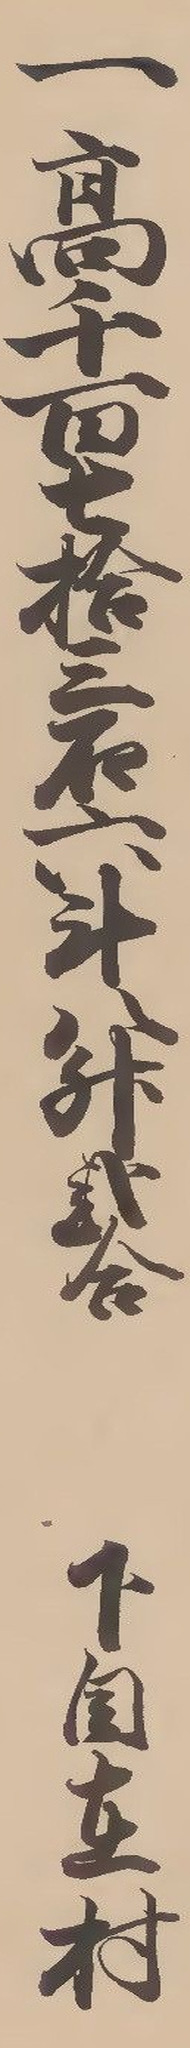一高千百七拾三石六斗八升弐合下自在村
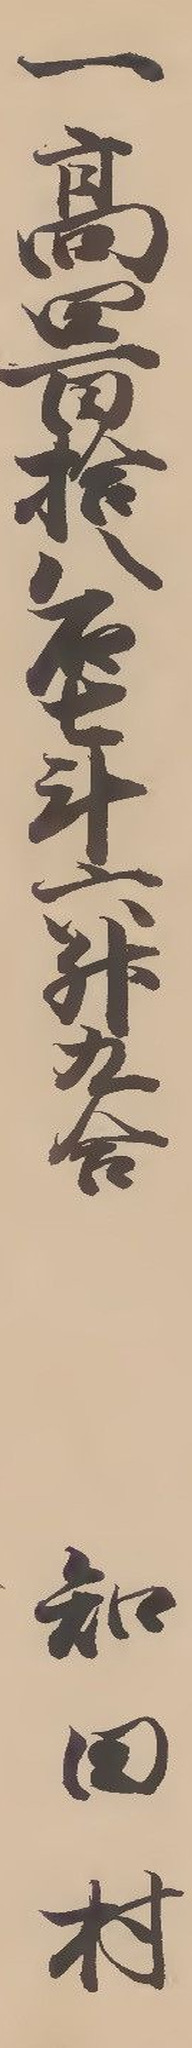一高四百拾八石七斗六升九合知田村

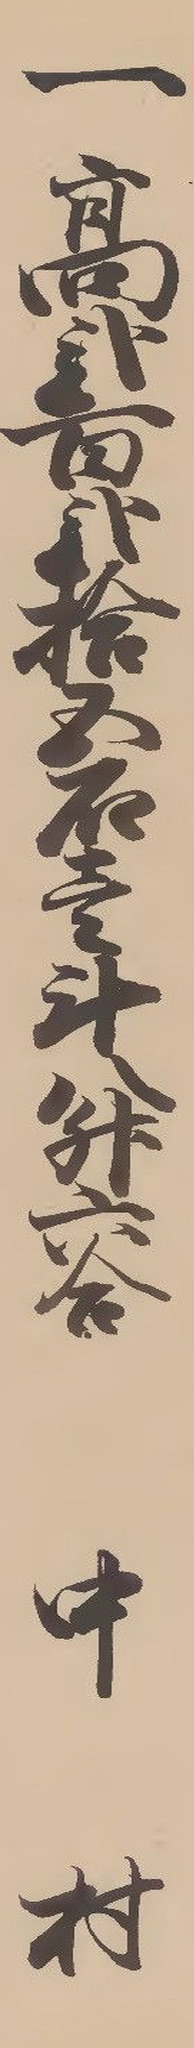一高弐百弐拾五石壱斗八升六合中村
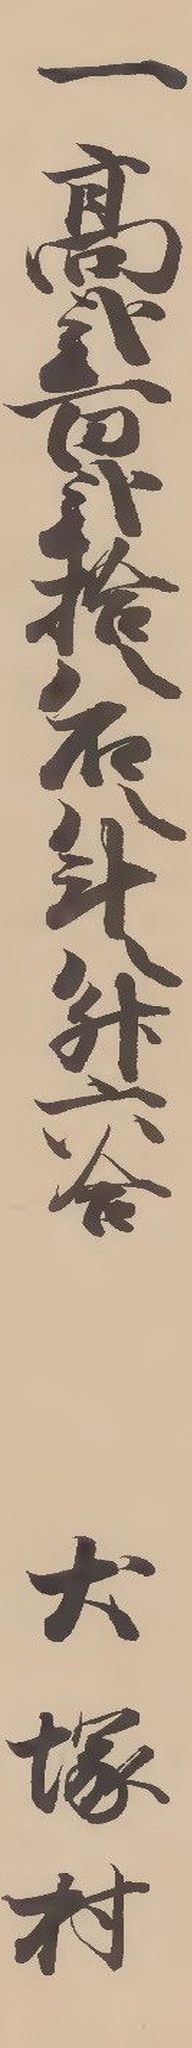一高弐百弐拾八石八斗八升六合犬塚村
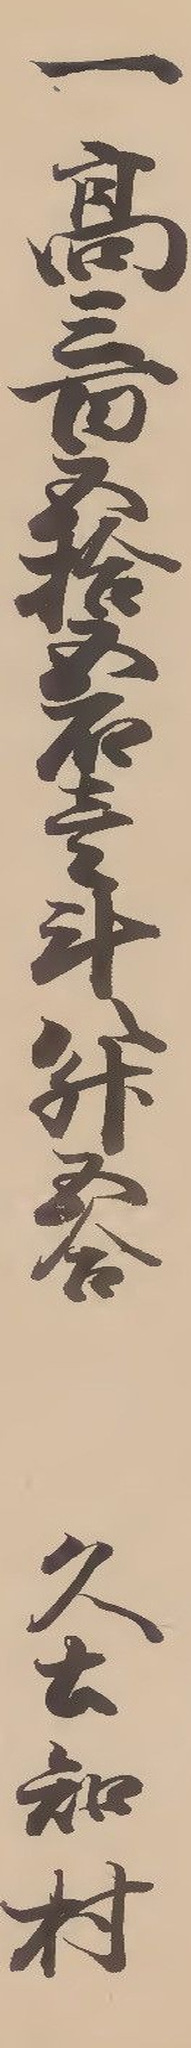一高三百五拾五石壱斗八升五合久土知村
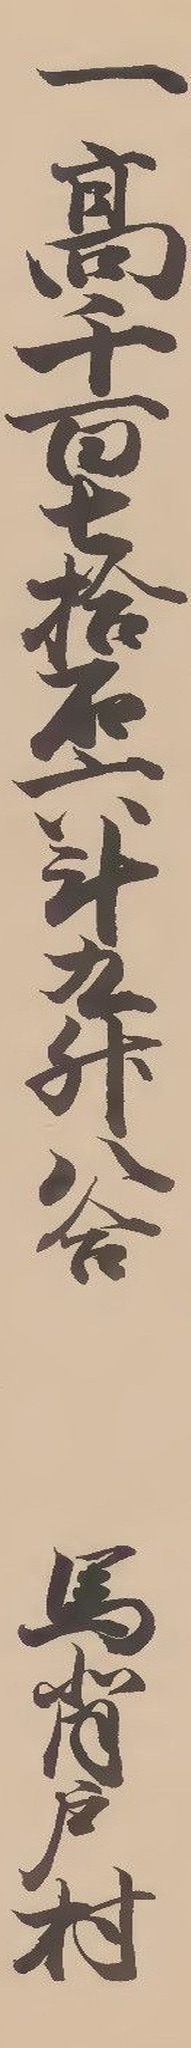一高千百七拾石六斗九升八合馬背戸村
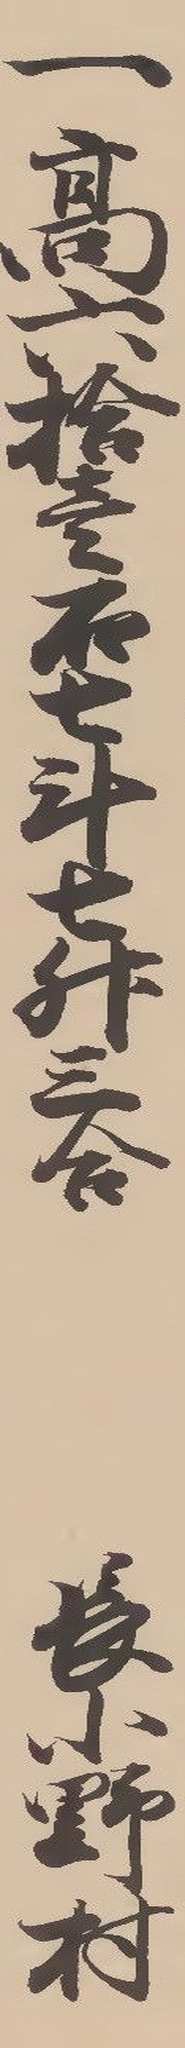一高六拾壱石七斗七升三合長小野村
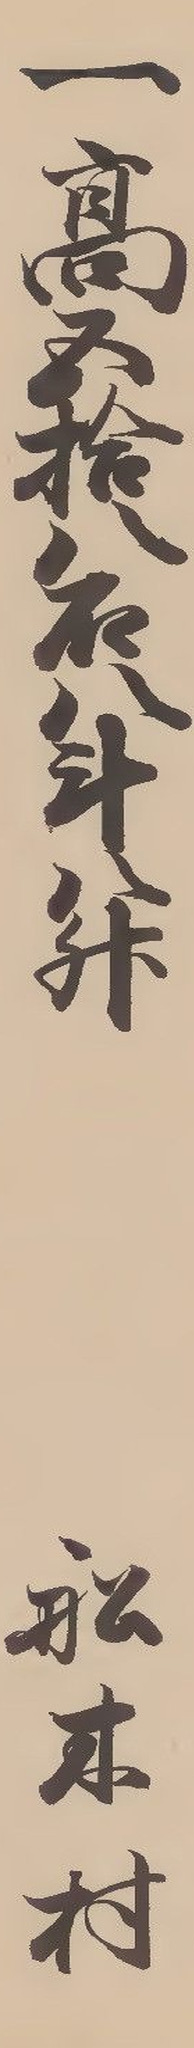一高五拾八石八斗八升船木村
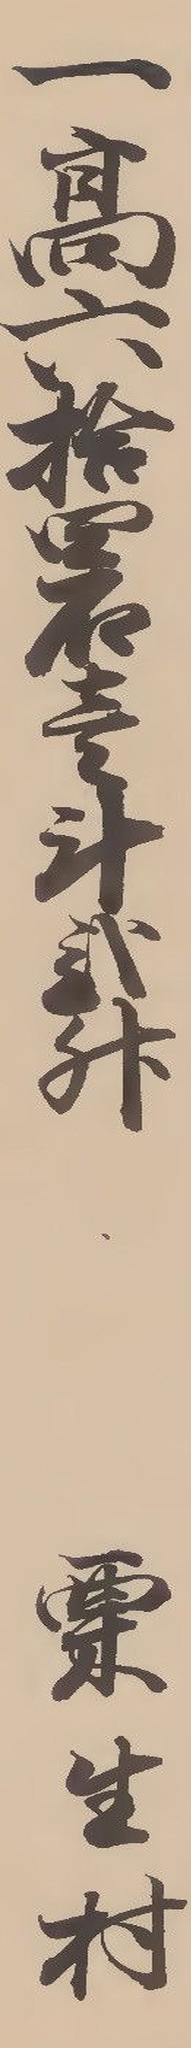一高六拾四石壱斗弐升栗生村
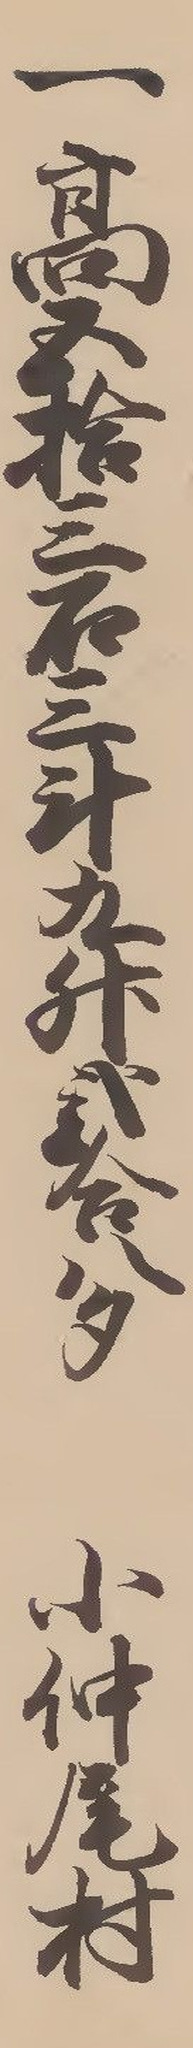一高五拾三石三斗九升弐合八勺小仲尾村

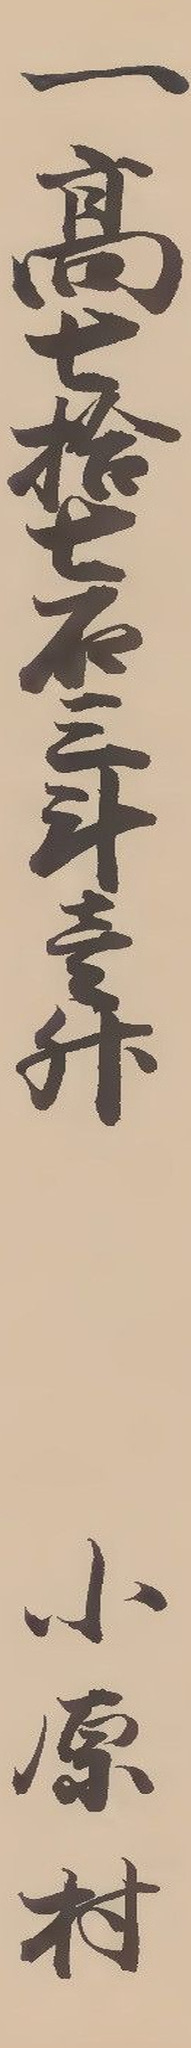一高七拾七石三斗壱升小原村
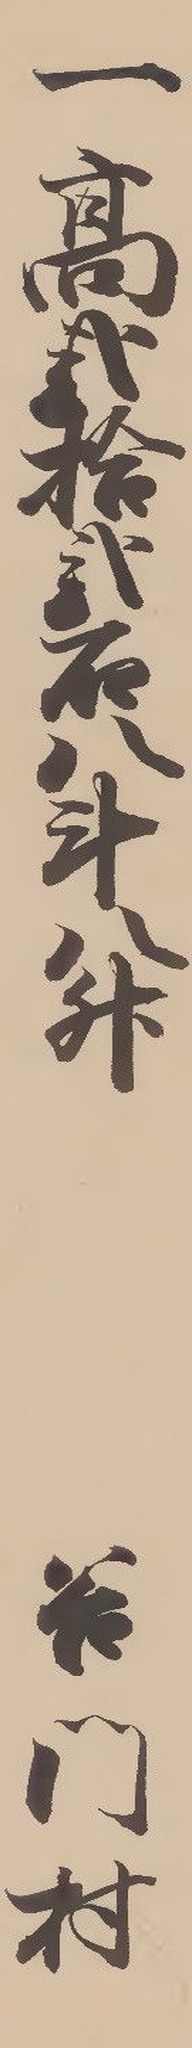一高弐拾弐石八斗八升谷門村
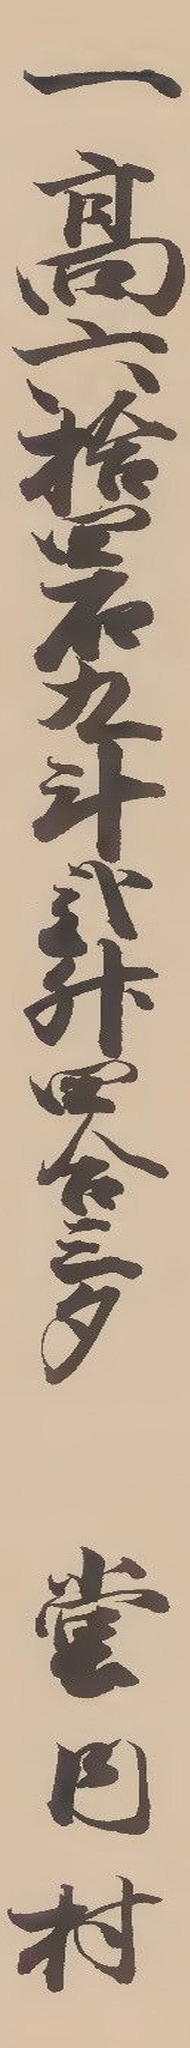一高六拾四石九斗弐升四合三勺堂内村
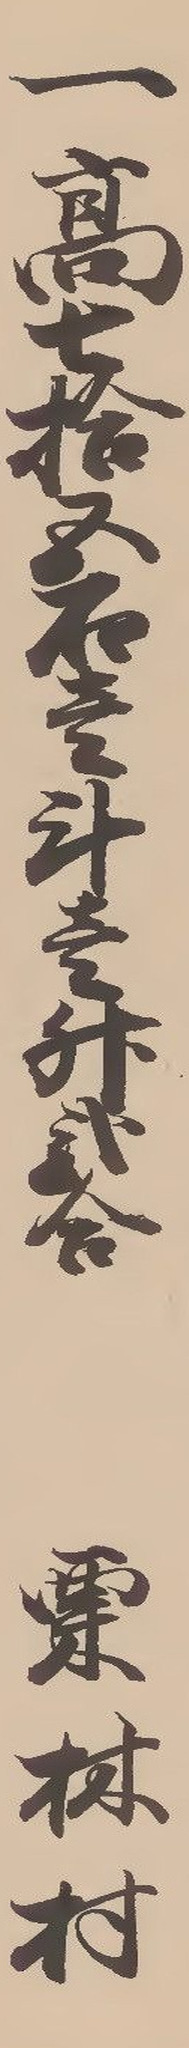一高七拾五石壱斗壱升弐合栗林村
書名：豊後国郷帳
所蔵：国立公文書館 National Archives of Japan
